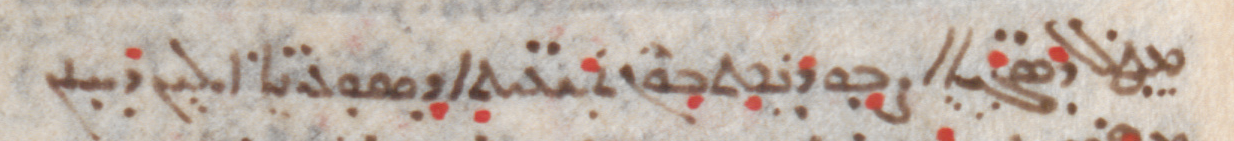ܡܛܠ ܕܣܓܝ̈ܐܐ ܨܒ̣ܘ ܕܢܟܬܒܘܢ ܬܫܥ̈ܝܬܐ ܕܣܘܥܪ̈ܢܐ ܐܝܠܝܢ ܕܚܢܢ
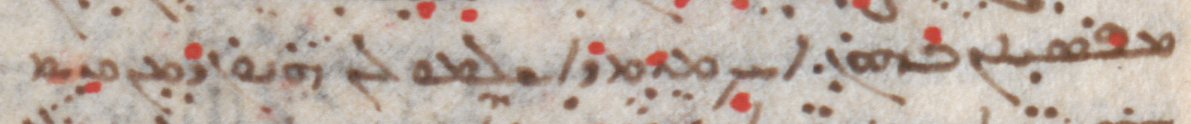ܡܦܣܝܢ ܒܗܘܢ܆ ܐܝܟ ܡܕܡ ܕܐܫܠܡܘ ܠܢ ܗܢܘܢ ܕܡ̣ܢ ܩܕܝܡ
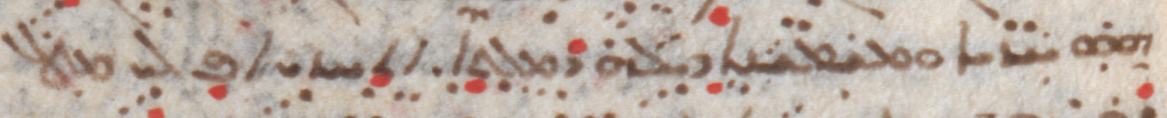ܗܘܘ ܚܙ̈ܝܐ ܘܡܫܡ̈ܫܢܐ ܕܝܠܗ̇ ܕܡܠܬܐ܆ ܐܬܚܙܝ ܐܦ ܠܝ ܡܛܠ
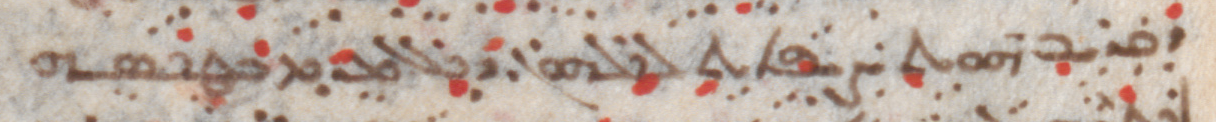ܕܩܪܝܒ ܗܘܝܬ ܝܨܝܦܐܝܬ ܠܟܠܗܘܢ܇ ܕܟܠ ܡܕܡ ܒܛܟܣܗ
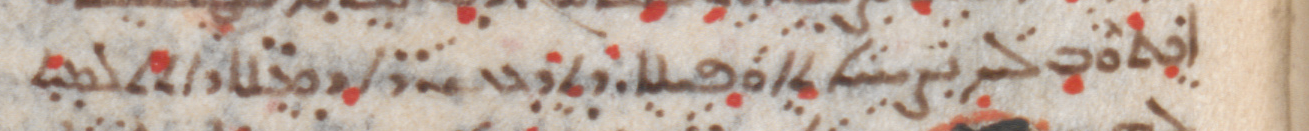ܐܟܬܘܒ ܠܟ ܢܨܝܚܐ ܬܐܘܦܝܠܐ. ܕܬܕܥ ܫܪܪܐ ܕܡ̈ܠܐ ܕܐܬܬܠܡܕܬ
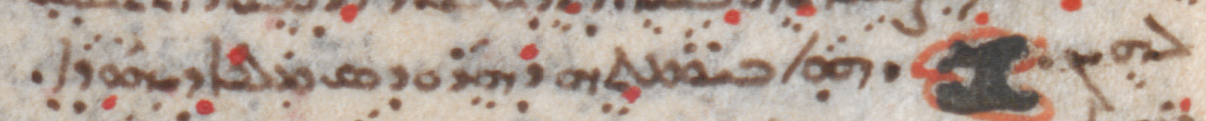ܠܗܝܢ ܀ ܗܘ̣ܐ ܒܝ̈ܘܡܬܗ ܕܗܪܘܕܣ ܡܠܟܐ ܕܝܗܘܕܐ܆
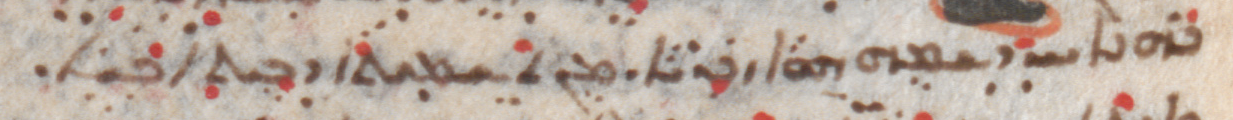ܟܗܢܐ ܚܕ ܕܫܡܗ ܗܘܐ ܙܟܪܝܐ. ܡ̣ܢ ܬܫܡܫܬܐ ܕܒܝܬ ܐܒܝܐ.
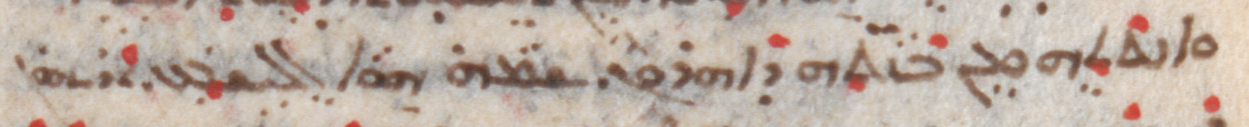ܘܐܢܬܬܗ ܡ̣ܢ ܒܢ̈ܬܗ ܕܐܗܪܘܢ. ܫܡܗ̇ ܗܘܐ ܐܠܝܫܒܥ. ܬܪܝܗܘܢ
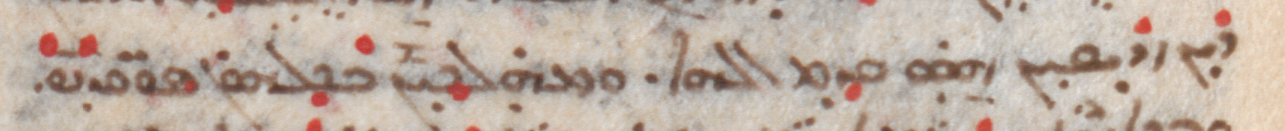ܕܝܢ ܙܕܝܩܝܢ ܗܘܘ ܩܕܡ ܐܠܗܐ. ܘܡܗܠܟܝܢ ܒܟܠܗܘܢ ܦܘܩ̈ܕ܏ܢܘ
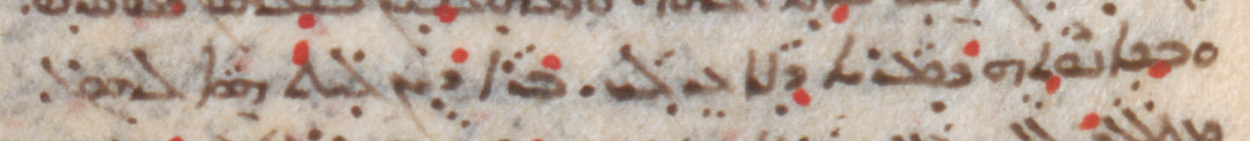ܘܒܟܐܢܘܬܗ ܕܡܪܝܐ ܕܠܐ ܥܕܠܝ. ܒܪܐ ܕܝܢ ܠܝܬ ܗܘܐ ܠܗܘܢ.
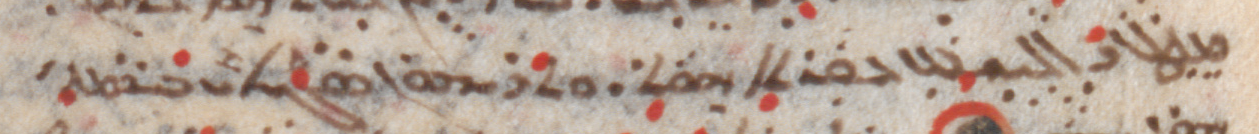ܡܛܠ ܕܐܠܝܫܒܥ ܥܩܪܬܐ ܗܘܬ. ܘܬܪܝܗܘܢ ܣ̈ܓܝܐܝ ܒܝܘ̈ܡܬ
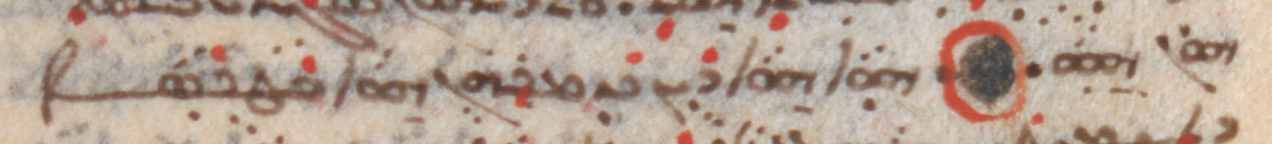ܗܘܢ ܗܘܘ ܀ ܗܘ̣ܐ ܗܘܐ ܕܝܢ ܟܕ ܡܟܗܢ ܗܘܐ ܒܛܟܣܐ
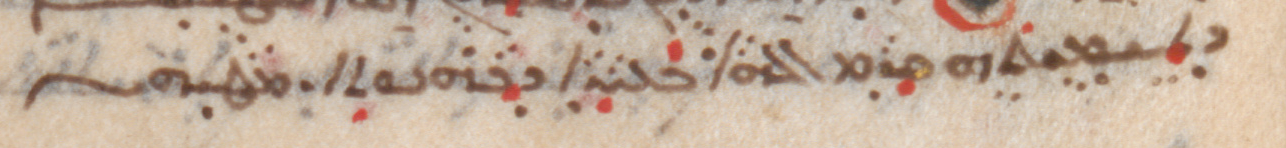ܕܬܫܡܫܬܗ ܩܕܡ ܐܠܗܐ ܒܥܝܕܐ ܕܟܗܢܘܬܐ. ܡܛܝܗܝ
